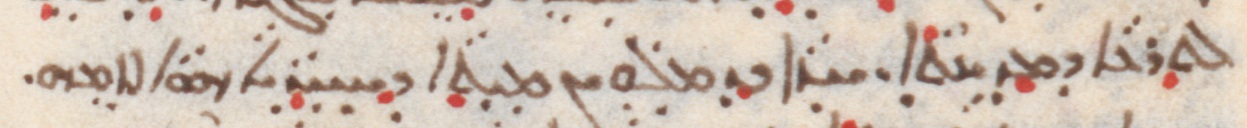ܠܬܪܥܐ ܕܡܕܝܢܬܐ. ܚܙ̣ܐ ܟܕ ܡܠܘܝܢ ܡܝܬܐ ܕܝܚܝܕܝܐ ܗܘ̇ܐ ܠܐܡܗ.
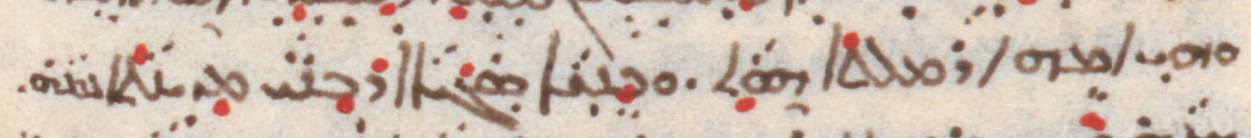ܘܗ̣ܝ ܐܡܗ ܐܪܡܠܬܐ ܗܘ̇ܬ. ܘܟܢܫܐ ܣܓܝܐܐ ܕܒܢ̈ܝ ܡܕܝܢܬܐ ܥܡܗ̇.
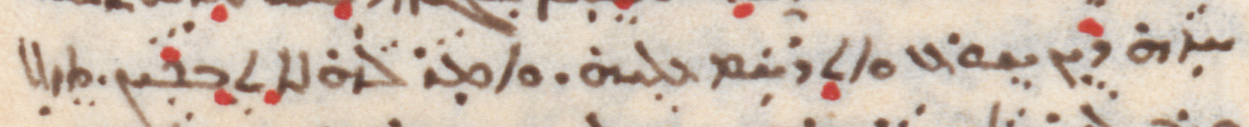ܚܙܗ̇ ܕܝܢ ܝܫܘܥ ܘܐܬܪܚܡ ܥܠܝܗ̇. ܘܐܡ̣ܪ ܠܗ̇ ܠܐ ܬܒܟܝܢ. ܘܐܙ̣ܠ
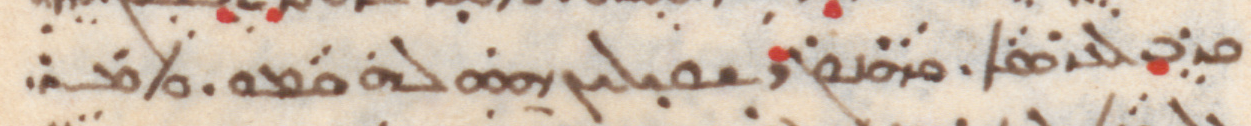ܩܪ̣ܒ ܠܥܪܣܐ. ܘܗ̇ܢܘܢ ܕܫܩܝܠܝܢ ܗܘܘ ܠܗ̇ ܩ̇ܡܘ. ܘܐܡ̇ܪ
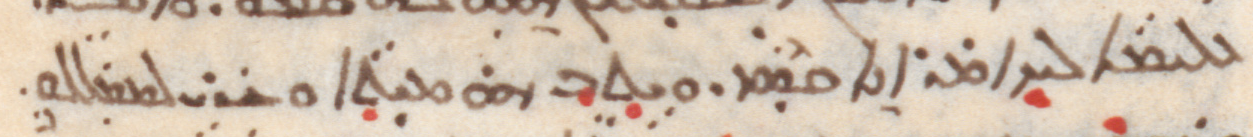ܥܠܝܡܐ ܠܟ ܐܡ̇ܪ ܐܢܐ ܩܘܡ. ܘܝܬ̣ܒ ܗ̇ܘ ܡܝܬܐ ܘܫܪܝ ܠܡܡܠܠܘ.
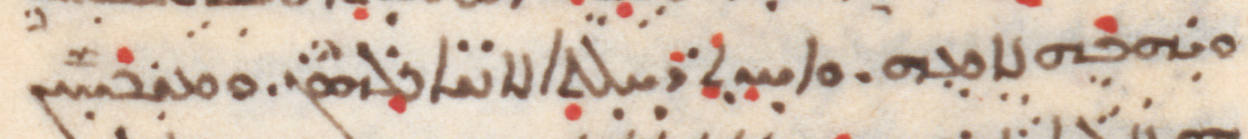ܘܝܗ̣ܒܗ ܠܐܡܗ. ܘܐܚܕܬ ܕܚܠܬܐ ܠܐܢܫܐ ܟܠܗܘܢ. ܘܡܫܒܚܝܢ
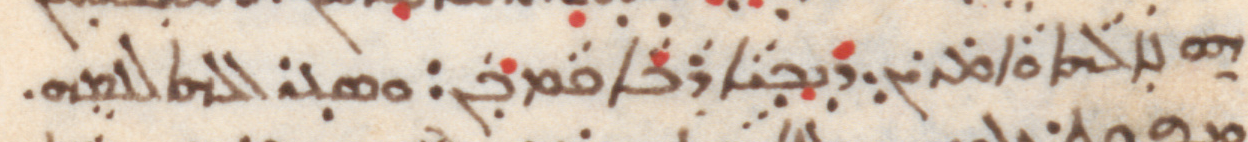ܗܘ ܠܐܠܗܐ ܘܐܡ̇ܪܝܢ܆ ܕܢܒܝܐ ܪܒܐ ܩܡ ܒܢ: ܘܣܥ̣ܪ ܐܠܗܐ ܠܥܡܗ.
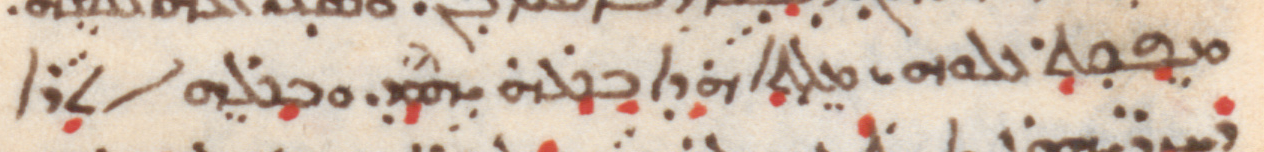ܘܢܦܩ̣ܬ݀ ܥܠܘܗܝ ܡܠܬܐ ܗܕܐ ܒܟܠܗ̇ ܝܗܘܕ. ܘܒܟܠܗ ܐܬܪܐ
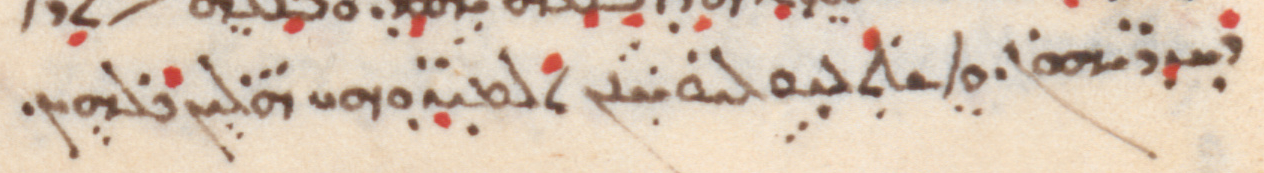ܕܚܕܪ̈ܝܗܘܢ. ܘܐܫܬܥܝܘ ܠܝܘܚܢܢ ܬܠܡܝܕ̈ܘܗܝ ܗܠܝܢ ܟܠܗܝܢ.
